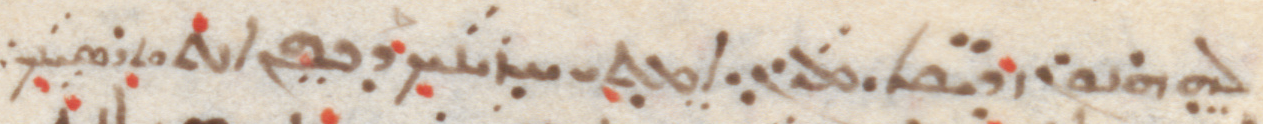ܠܗ ܗܢܘܢ ܙܕܝܩ̈ܐ. ܡܪܢ܆ ܐܡܬܝ ܚܙܝܢܟ ܕܟܦܢ ܐܢܬ ܘܬܪܣܝܢܟ܇
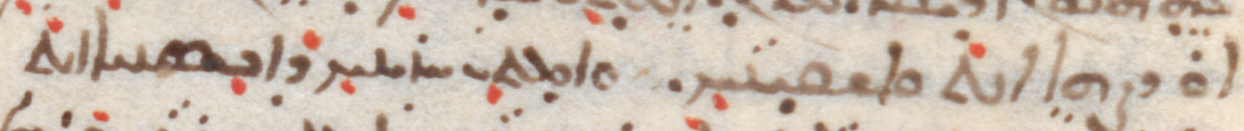ܐܘ ܕܨܗܐ ܐܢܬ ܘܐܫܩܝܢܟ. ܘܐܡܬܝ ܚܙܝܢܟ ܕܐܟܣܢܝܐ ܐܢܬ
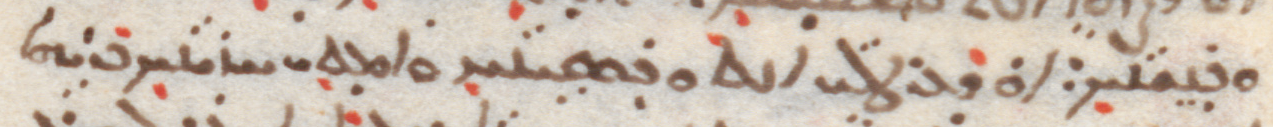ܘܟܢܫܢܟ: ܐܘ ܕܥܪܛܠܝ ܐܢܬ ܘܟܣܝܢܟ ܘܐܡܬܝ ܚܙܝܢܟ ܟܪܝܗܐ
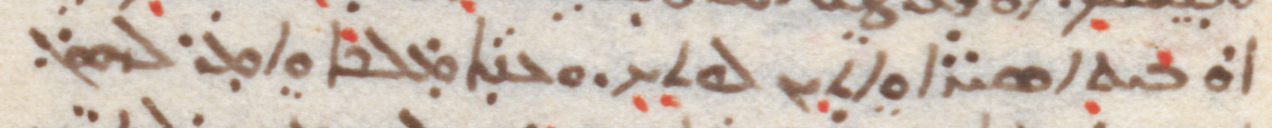ܐܘ ܒܝܬ ܐܣܝܪ̈ܐ ܘܐܬܝܢ ܠܘܬܟ. ܘܥܢ̣ܐ ܡܠܟܐ ܘܐܡ̣ܪ ܠܗܘܢ.
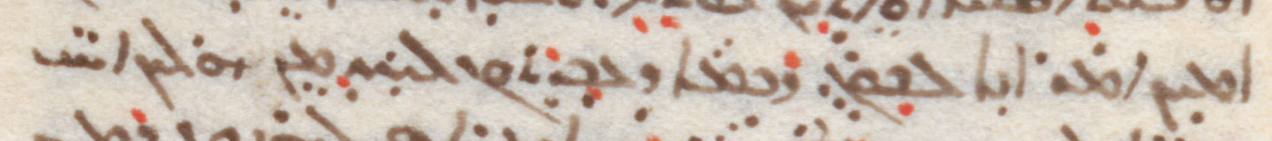ܐܡܝܢ ܐܡ̇ܪ ܐܢܐ ܠܟܘܢ܆ ܕܟܡܐ ܕܥܒܕܬܘܢ ܠܚܕ ܡܢ ܗܠܝܢ ܐܚ̈ܝ
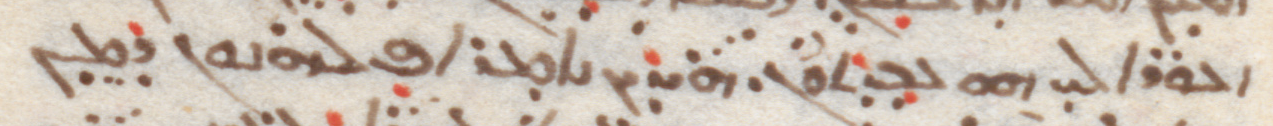ܙܥܘܪ̈ܐ ܠܝ ܗܘ ܥܒܕܬܘܢ. ܗܝܪܝܢ ܢܐܡ̣ܪ ܐܦ ܠܗܢܘܢ ܕܡ̣ܢ
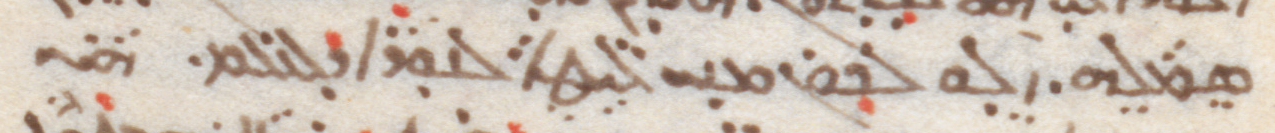ܣܡܠܗ ܙܠܘ ܠܟܘܢ ܡܢܝ ܠ̈ܝܛܐ ܠܢܘܪܐ ܕܠܥܠܡ. ܗ̇ܝ
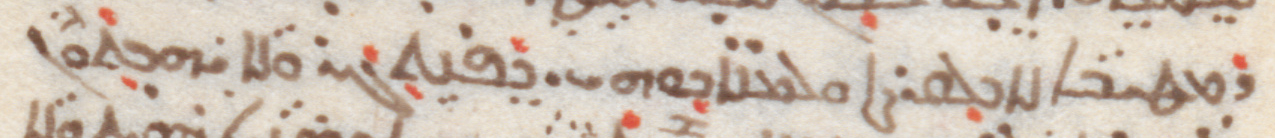ܕܡܛܝܒܐ ܠܐܟܠܩܪܨܐ ܘܠܡܠ̈ܐܟܘܗܝ. ܟܦܢܬ ܓܝܪ ܘܠܐ ܝܗܒܬܘܢ
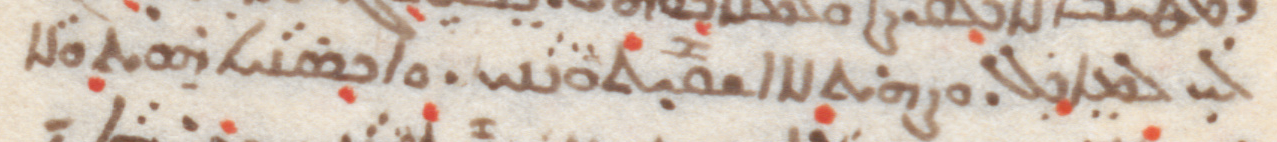ܠܝ ܠܡܐܟܠ. ܘܨܗܝܬ ܠܐ ܐܫܩܝܬܘܢܢܝ. ܘܐܟܣܢܝܐ ܗܘܝܬ ܘܠܐ
